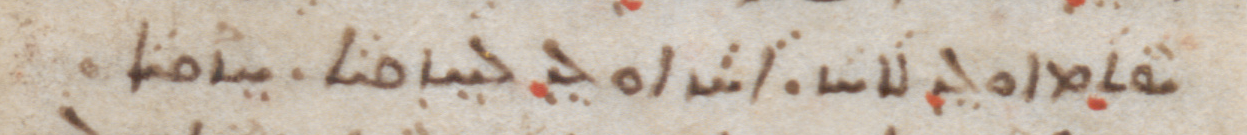ܝܘܬܡ ܐܘܠܕ ܠܐܚܙ. ܐܚܙ ܐܘܠܕ ܠܚܙܩܝܐ. ܚܙܩܝܐ
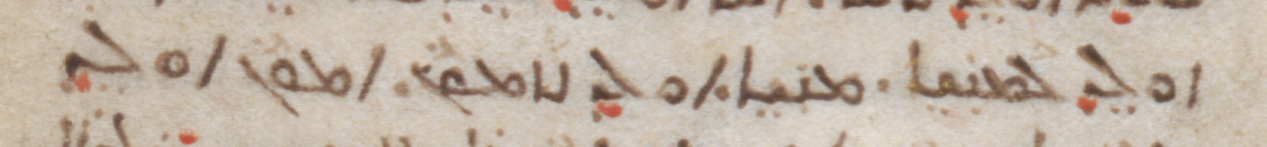ܐܘܠܕ ܠܡܢܫܐ. ܡܢܫܐ ܐܘܠܕ ܠܐܡܘܢ. ܐܡܘܢ ܐܘܠܕ
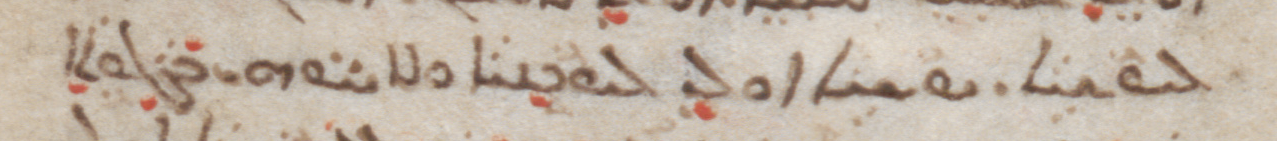ܠܝܘܫܝܐ. ܝܘܫܝܐ ܐܘܠܕ ܠܝܘܟܢܝܐ ܘܠܐܚ̈ܘܗܝ ܒܓܠܘܬܐ
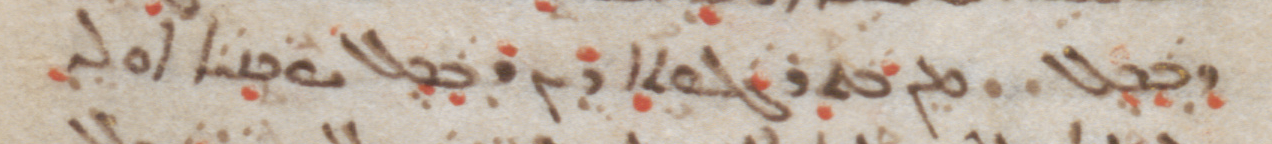ܕܒܒܠ.. ܡ̣ܢ ܒܬܪ ܓܠܘܬܐ ܕܝܢ ܕܒܒܠ ܝܘܟܢܝܐ ܐܘܠܕ
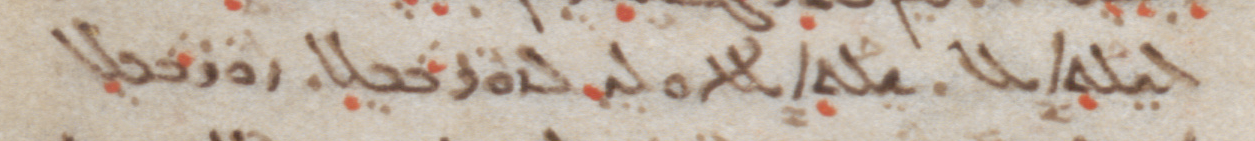ܠܫܠܬܐܝܠ. ܫܠܬܐܝܠ ܐܘܠܕ ܠܙܘܪܒܒܠ. ܙܘܪܒܒܠ
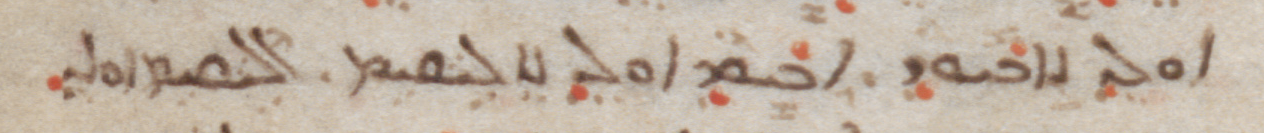ܐܘܠܕ ܠܐܒܝܘܕ. ܐܒܝܘܕ ܐܘܠܕ ܠܐܠܝܩܝܡ .ܐܠܝܩܝܡ ܐܘܠܕ
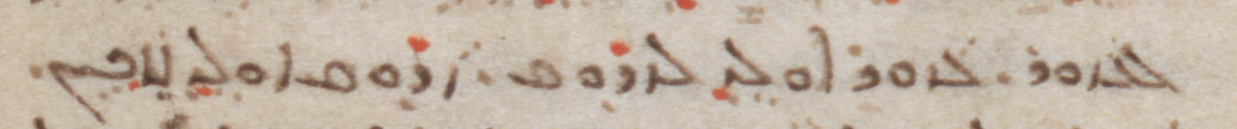ܠܥܙܘܪ. ܥܙܘܪ ܐܘܠܕ ܠܙܕܘܩ ܙܕܘܩ ܐܘܠܕ ܠܐܟܝܢ.
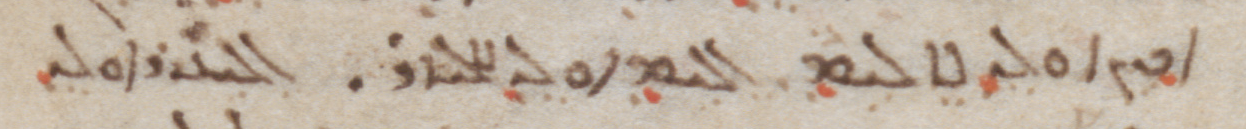ܐܟܝܢ ܐܘܠܕ ܠܐܠܝܘܕ ܐܠܝܘܕ ܐܘܠܕ ܠܐܠܝܥܙܪ. ܐܠܝܥܙܪ ܐܘܠܕ
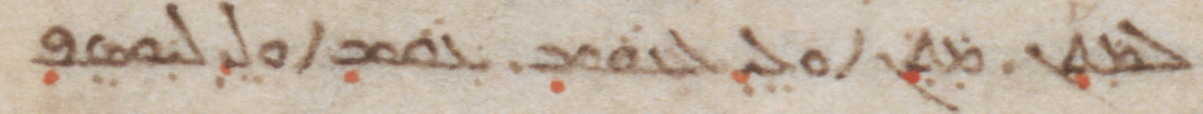ܠܡܬܢ ܡܬܢ ܐܘܠܕ ܠܝܥܩܘܒ. ܝܥܩܘܒ ܐܘܠܕ ܠܝܘܣܦ
